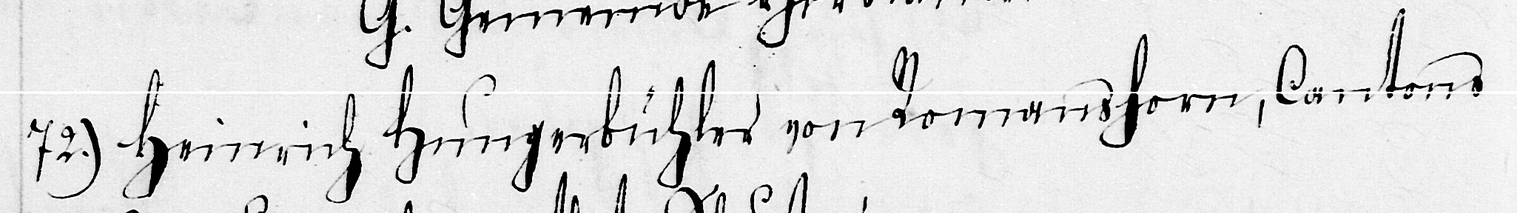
72.) Heinrich Hungerbühler von Romanshorn, Cantons
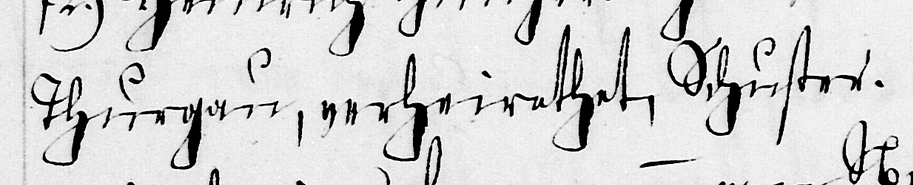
Thurgau, verheirathet, Schuster.
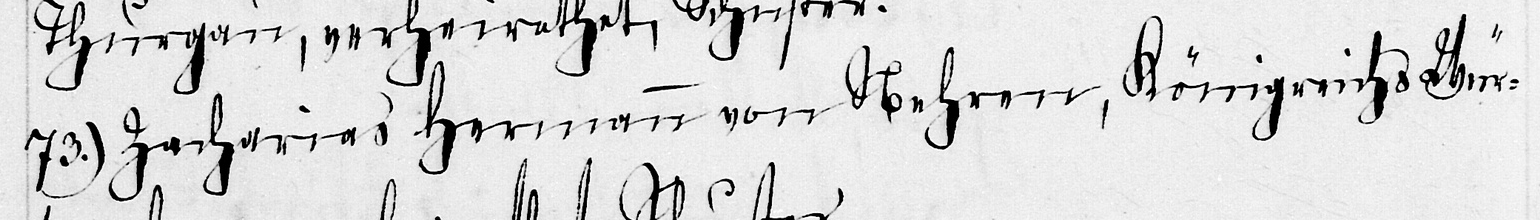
73.) Zacharias Hermann von Nehren, Königreichs Wür¬
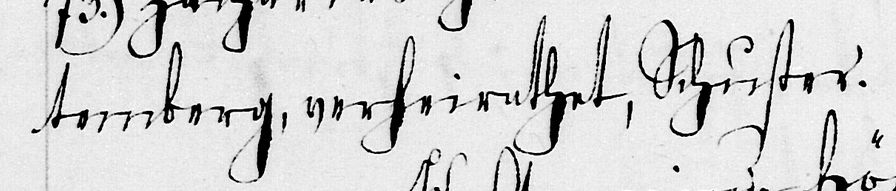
temberg, verheirathet, Schuster.
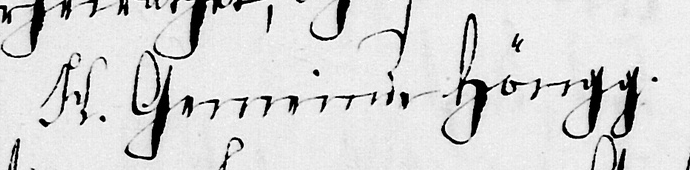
H. Gemeinde Höngg.
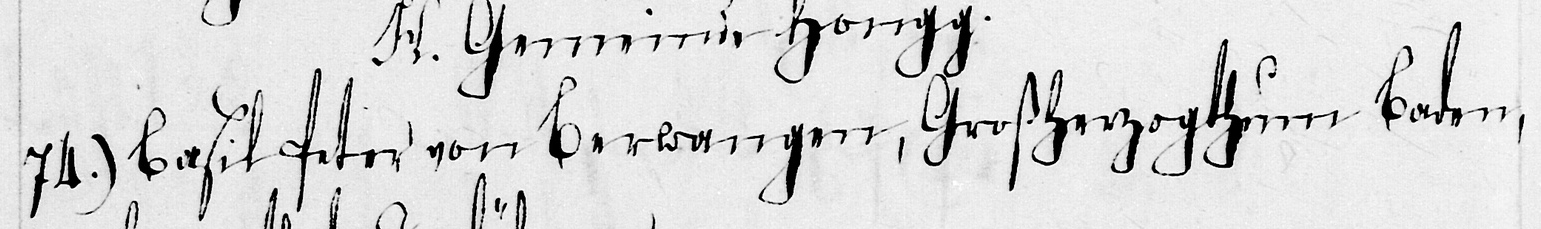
74.) Basil Peter von Berwangen, Großherzogthum Baden,
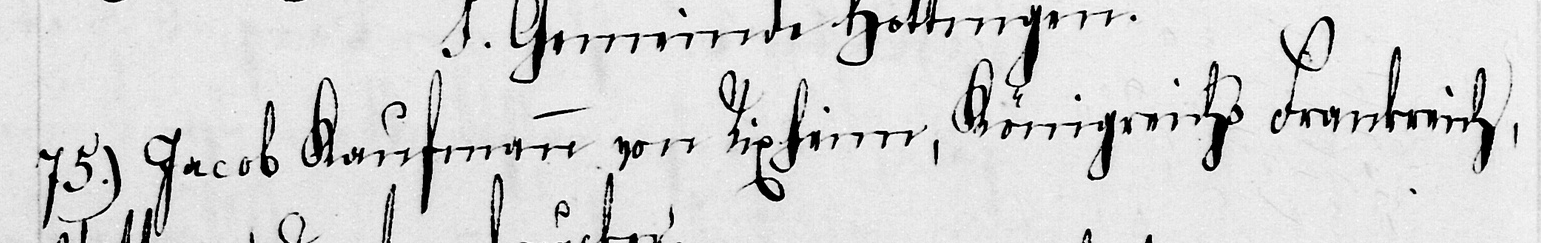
75.) Jacob Kaufmann von Rixheim, Königreichs Frankreich,
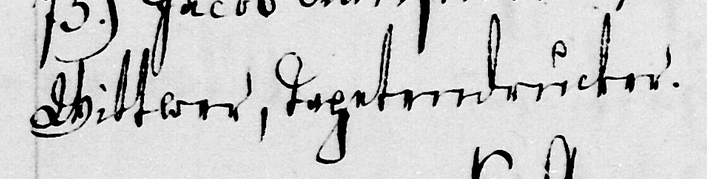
Wittwer, Tapetendrucker.
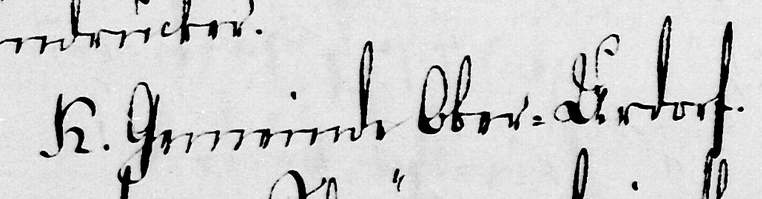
K. Gemeinde Ober-Urdorf.
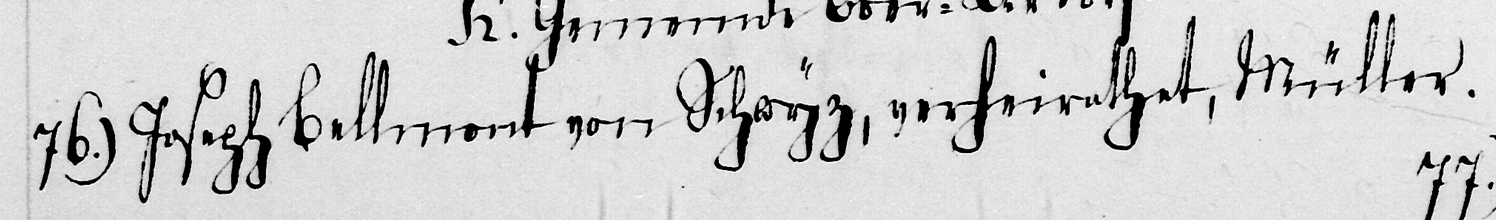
76.) Joseph Bellmont von Schwyz, verheirathet, Müller.
